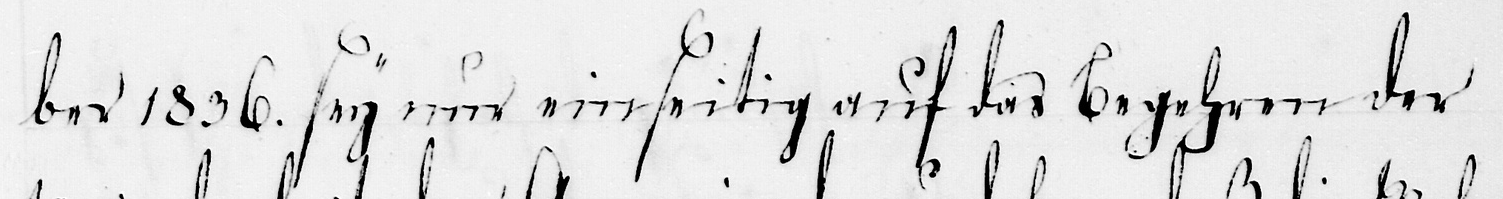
ber 1836. sey nur einseitig auf das Begehren der
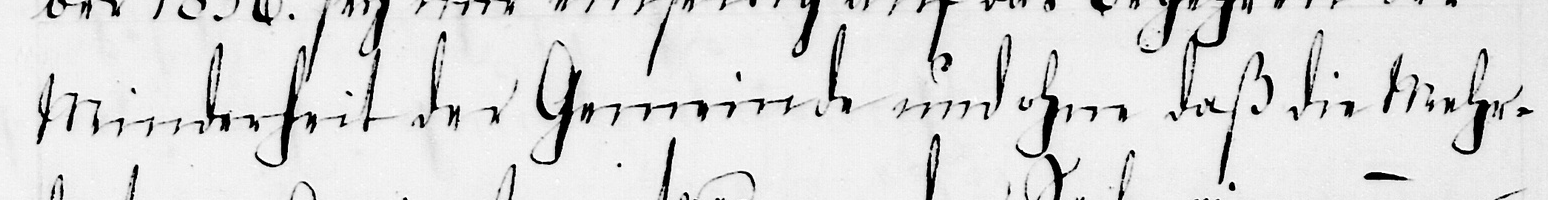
Minderheit der Gemeinde und ohne daß die Mehr¬
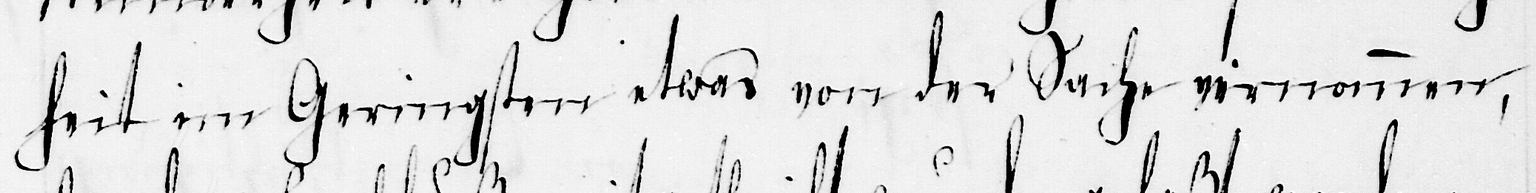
heit im Geringsten etwas von der Sache vernommen,
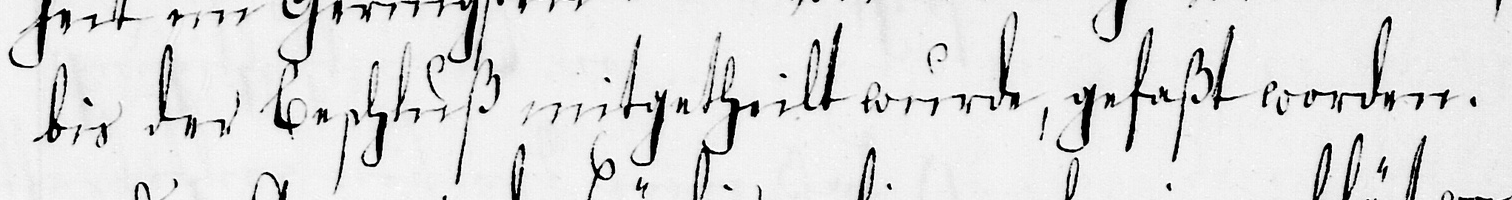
bis der Beschluß mitgetheilt wurde, gefaßt worden.
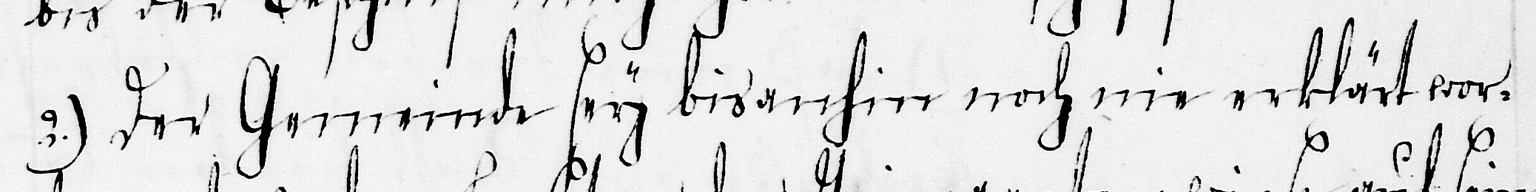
2.) Der Gemeinde sey bis anhin noch nie erklärt wor¬
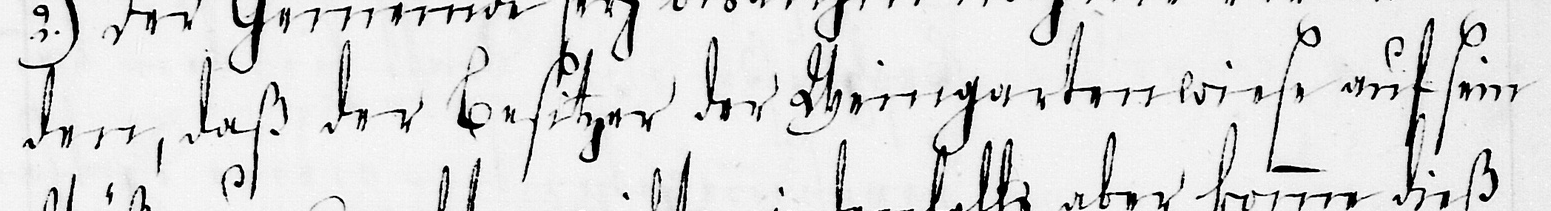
den, daß der Besitzer der Weingartenwiese auf sein
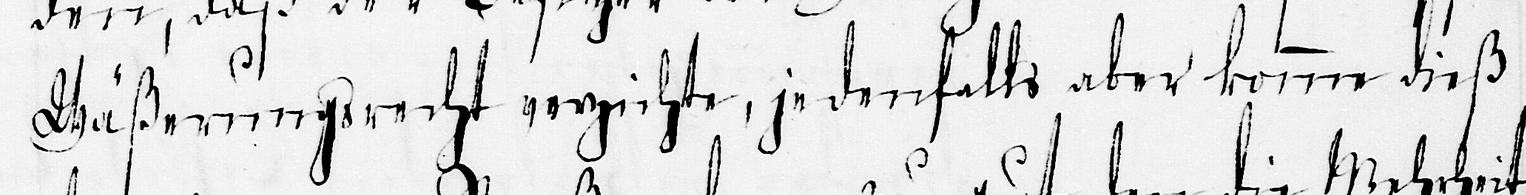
Wäßerungsrecht verzichte, jedenfalls aber komme dieß
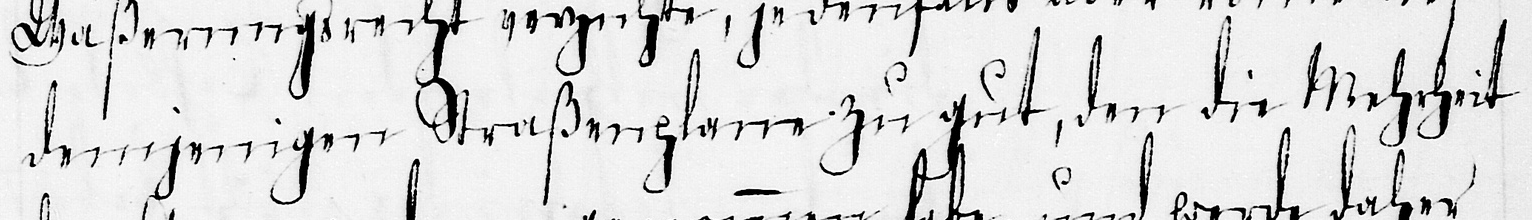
demjenigen Straßenplane zu gut, den die Mehrheit
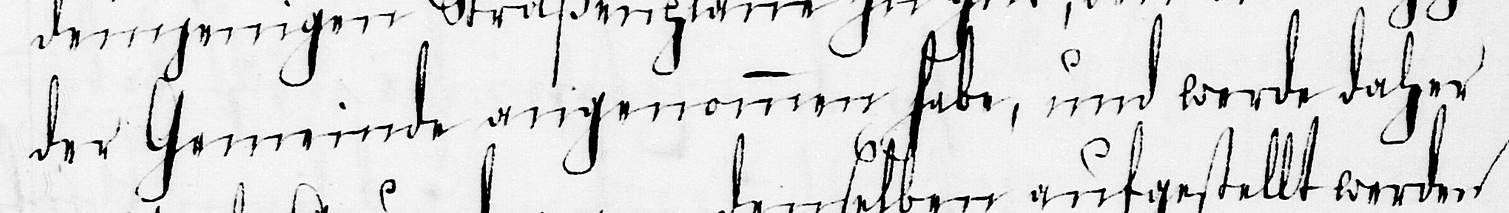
der Gemeinde angenommen habe, und werde daher
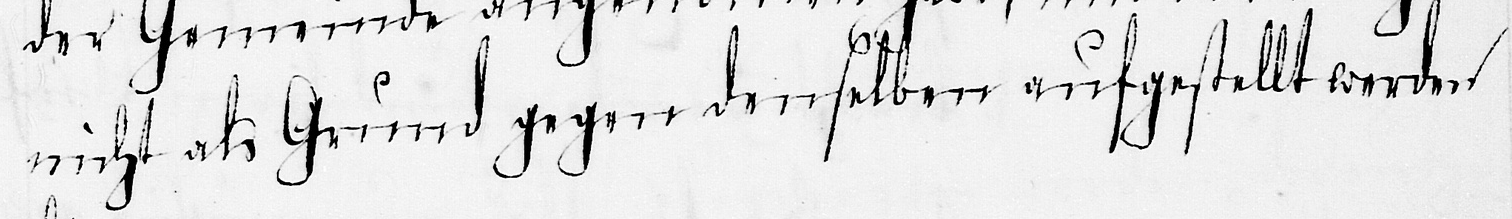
nicht als Grund gegen denselben aufgestellt werden
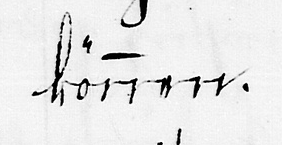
können.
